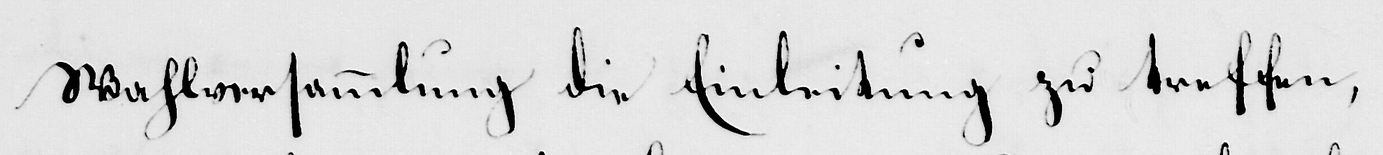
Wahlversammlung die Einleitung zu treffen,
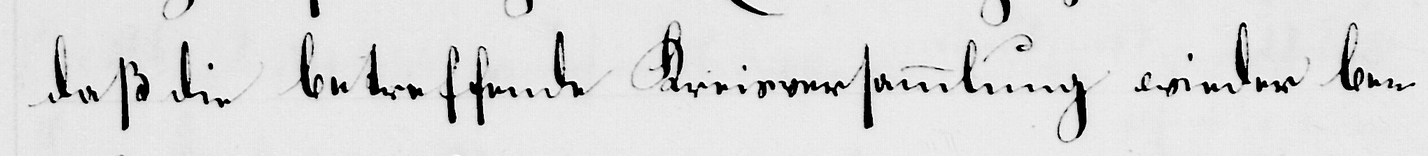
daß die betreffende Kreisversammlung wieder be¬
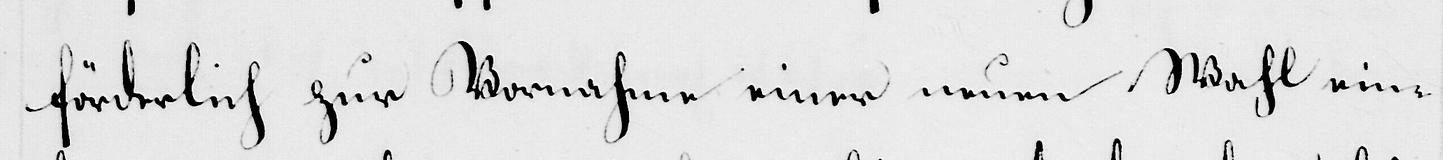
förderlich zur Vornahme einer neuen Wahl ein¬
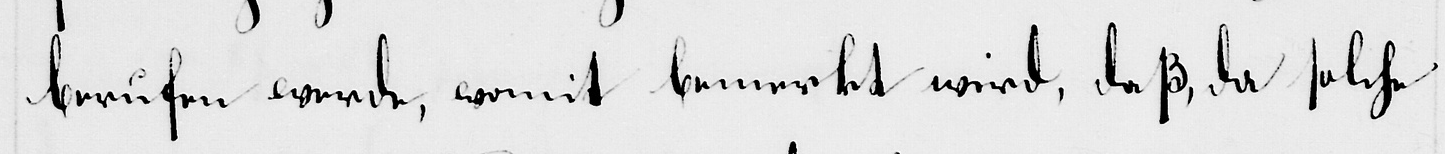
berufen werde, womit bemerkt wird, daß, da solche
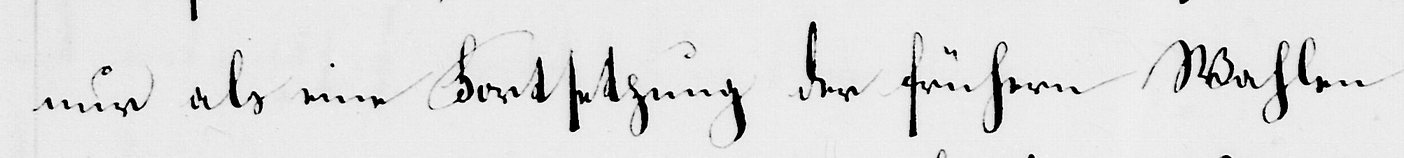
nur als eine Fortsetzung der frühern Wahlen
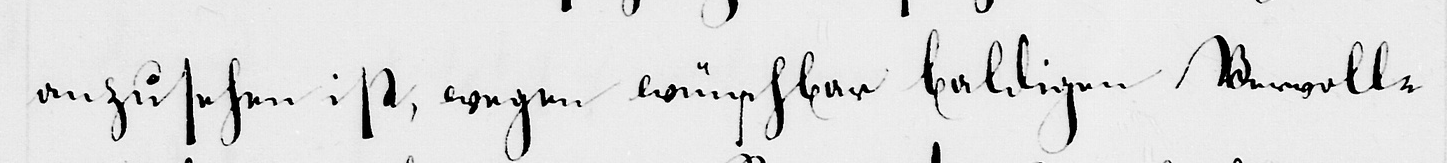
anzusehen ist, wegen wünschbar baldigen Vervoll¬
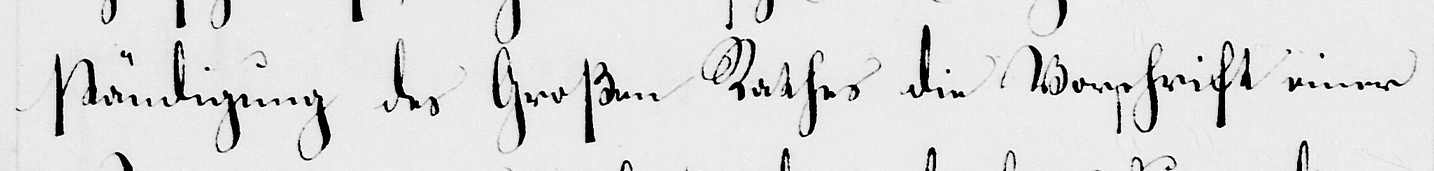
ständigung des Großen Rathes die Vorschrift einer
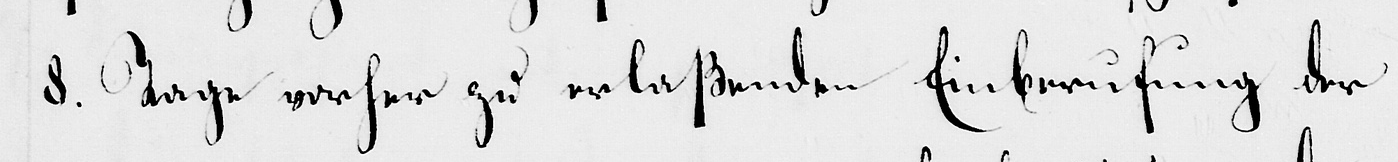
8. Tage vorher zu erlaßenden Einberufung der
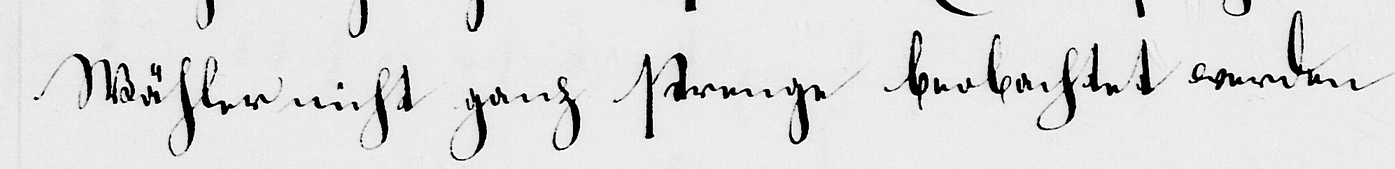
Wähler nicht ganz strenge beobachtet werden
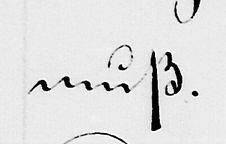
muß.
